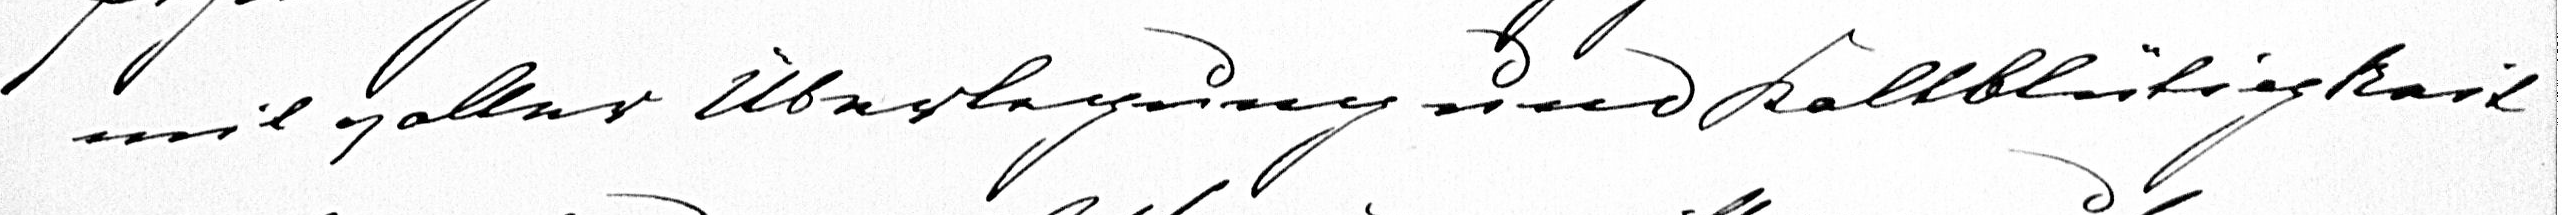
mit voller Überlegung und Kaltblütigkeit
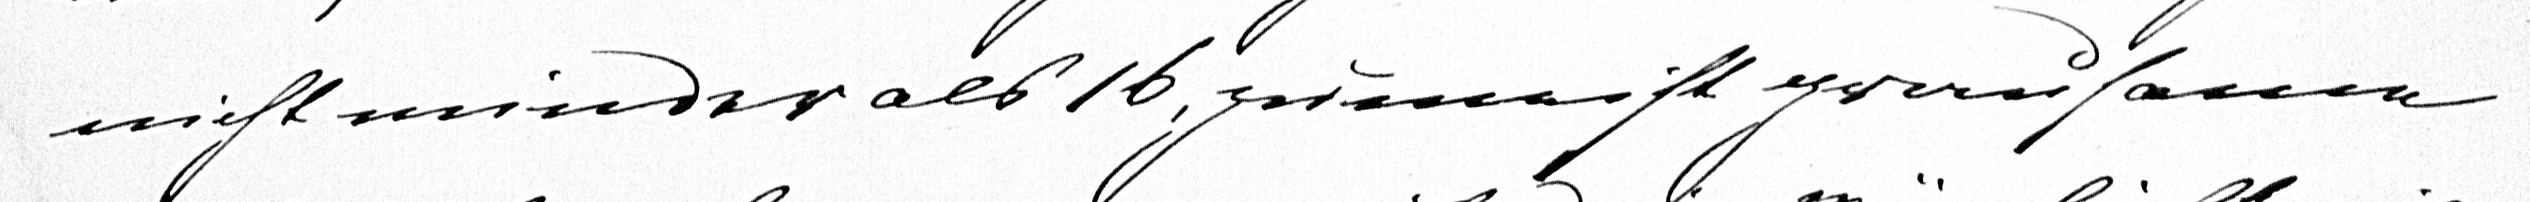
nicht minder als 16, zu meist grausame
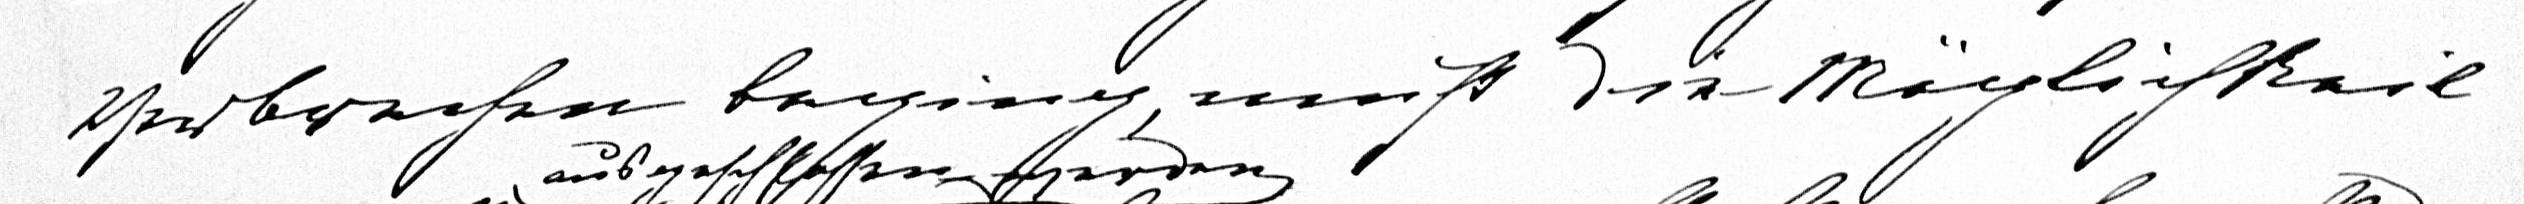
verbrechen beging, meist die Möglichkeit
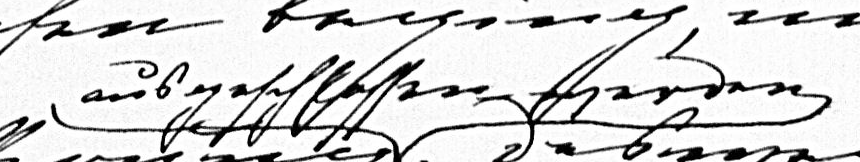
aus geschlossen werden
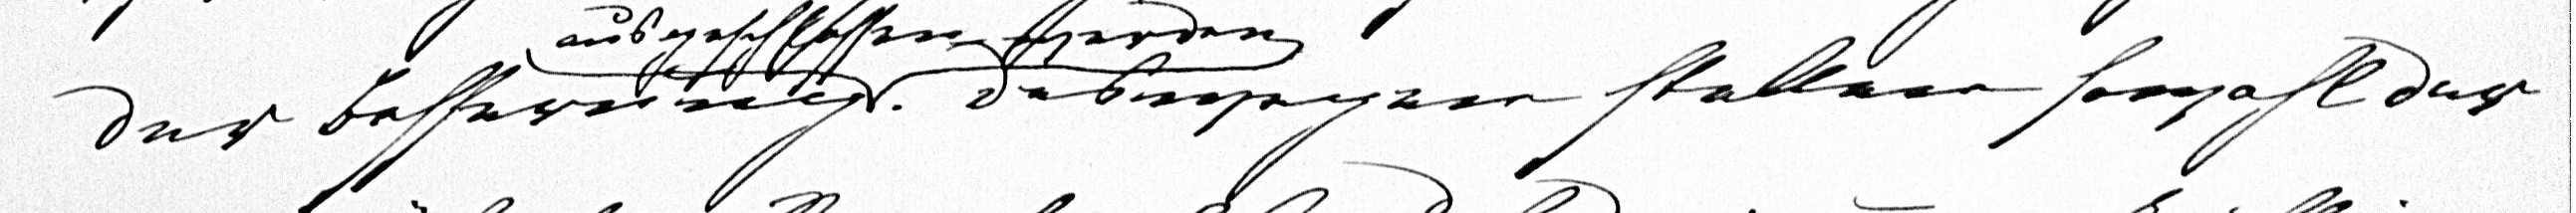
der Besserung. Deswegen stellen sowohl der
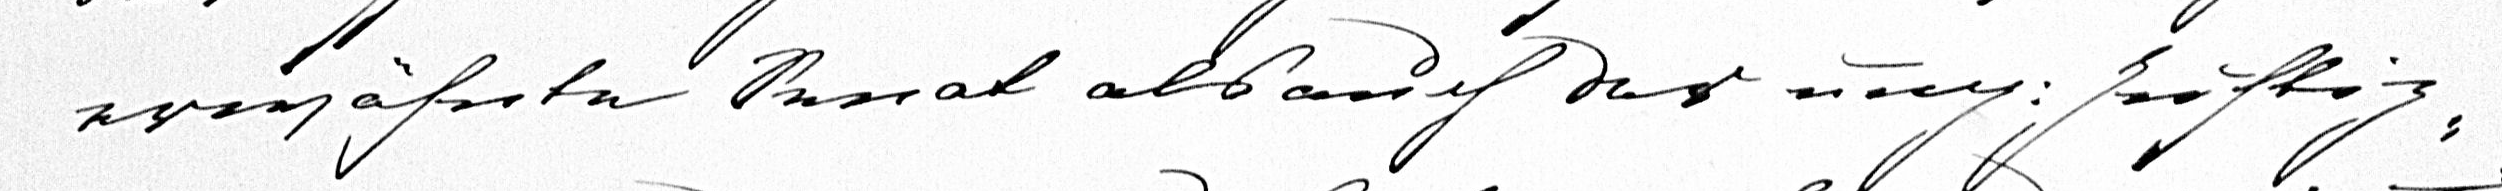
erwähnte Senat als auch der ung: Justiz¬
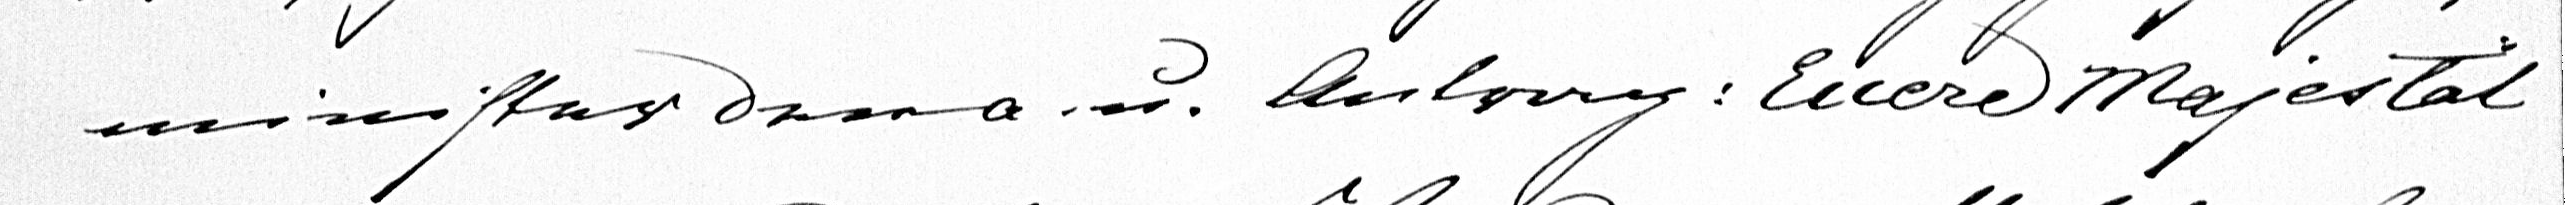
minister den a. u. Antrag: Euere Majestät
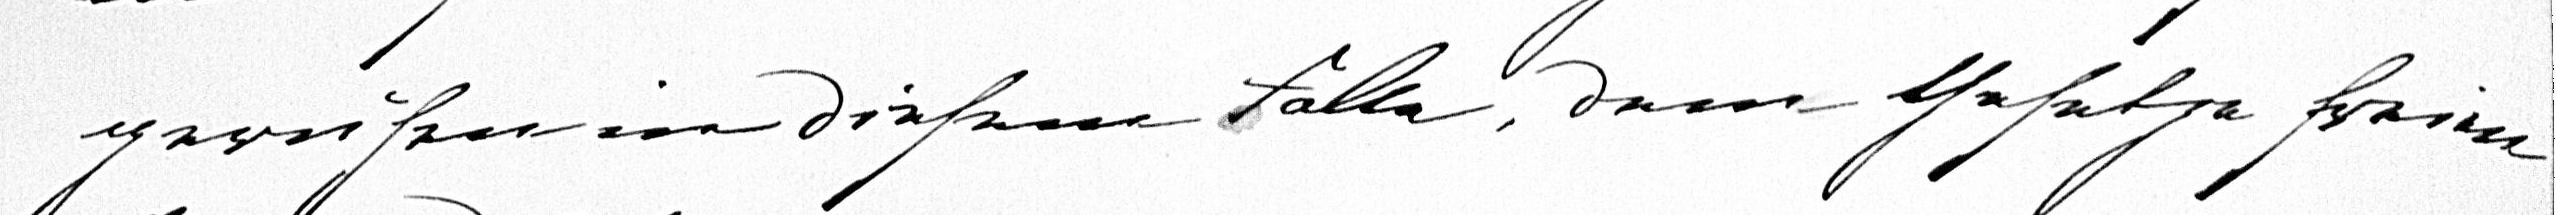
geruhen in diesem Falte, dem Gesetze freien
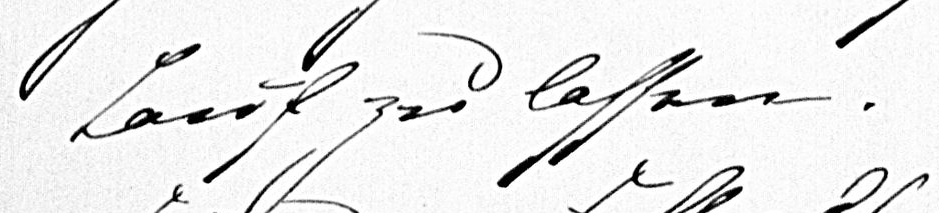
Lauf zu lassen.
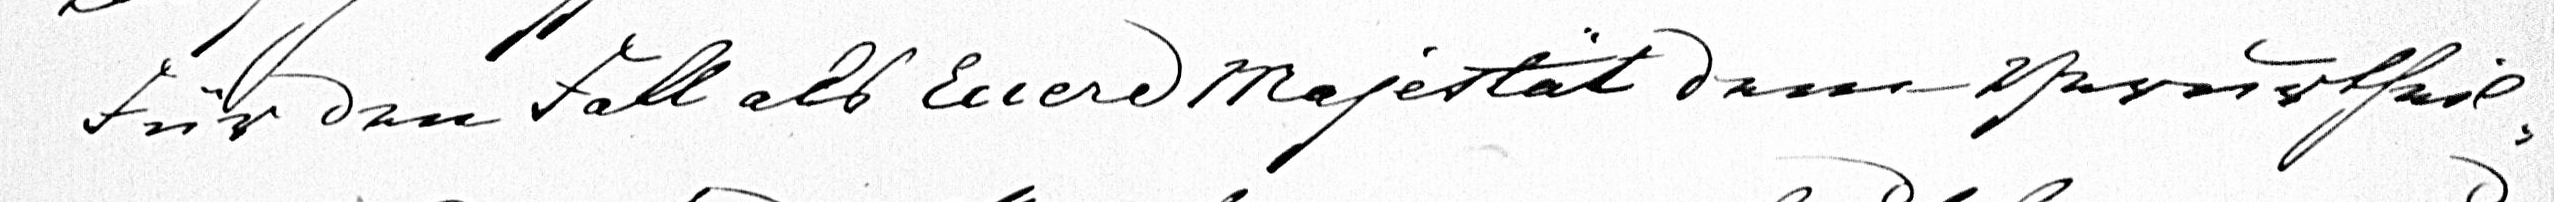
Für den Falt als Euere Majestät dem Verurtheil¬
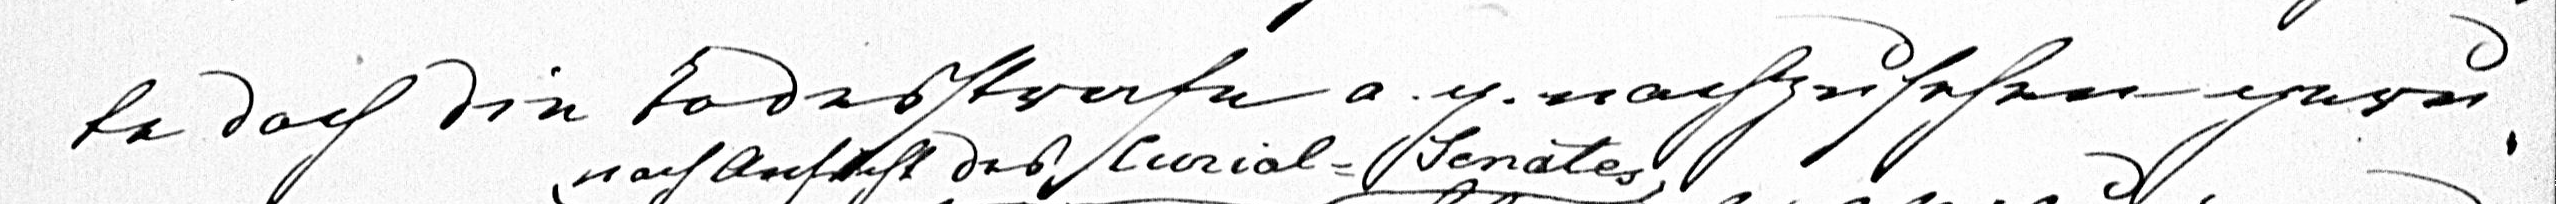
te doch die Todesstrafe a. g. nachzusehen geru¬
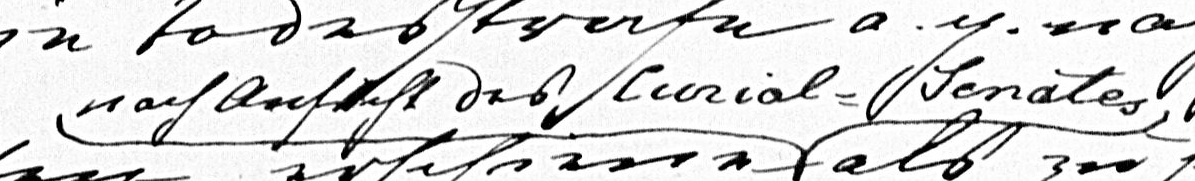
nach Ansucht des Curial-Senates
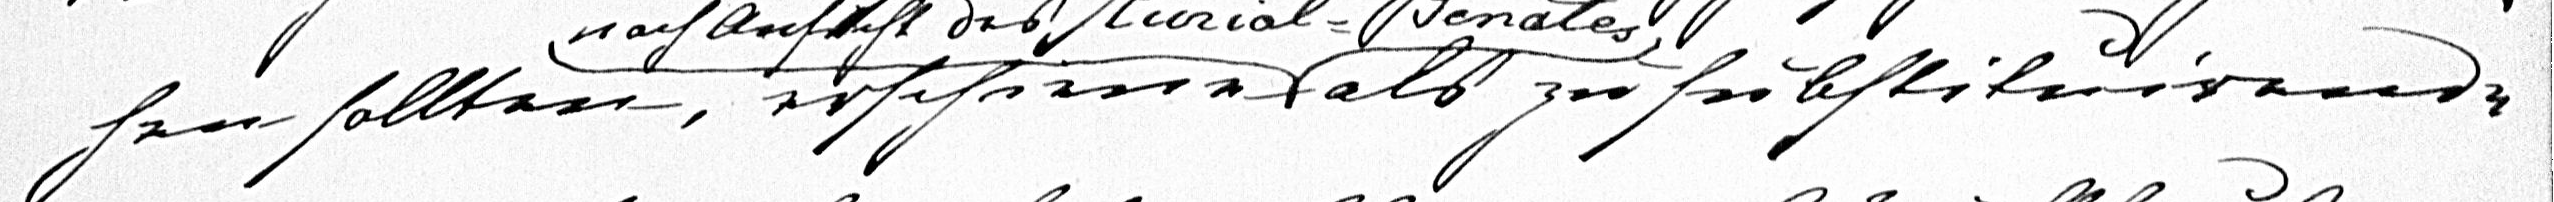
hen sollten, erschiene als zu substituirende
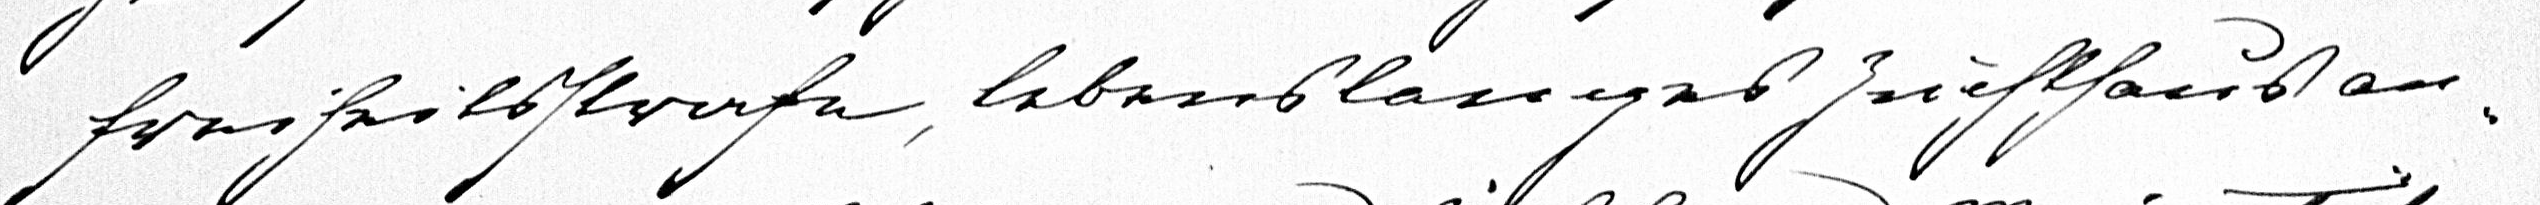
Freiheitsstrafe, lebenslanges Zuchthaus an¬
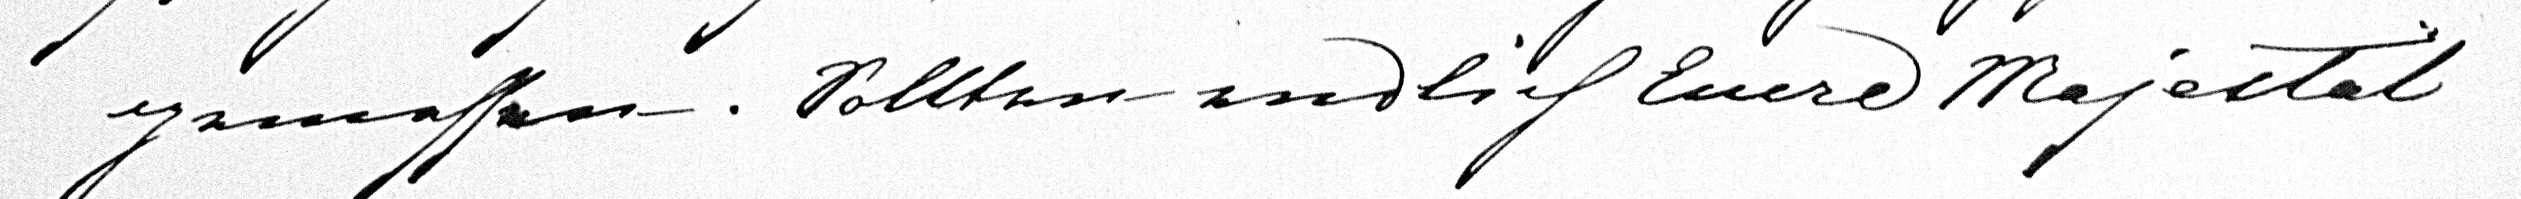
gemessen. Sollten endlich Euere Majestät
